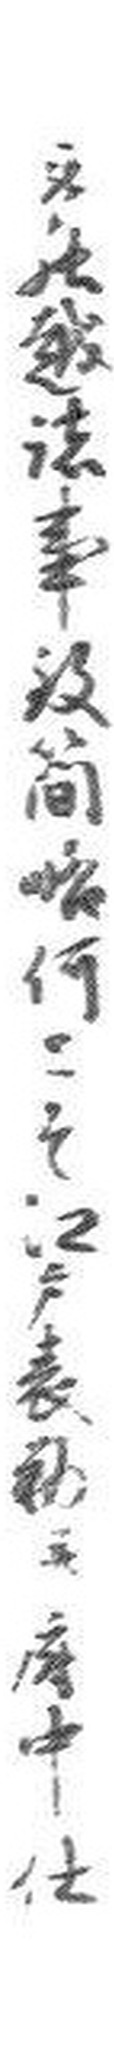被罷越諸事致簡略何とそ江戸表勤并府中仕
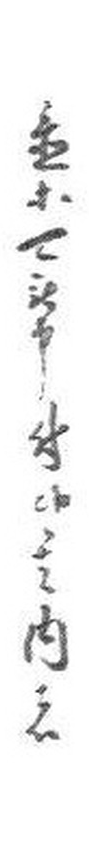置等被申付候其内者
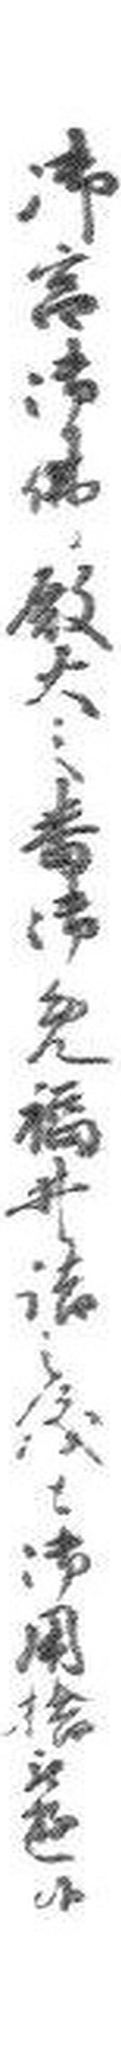御宮御仏殿大之番御免福井諸之儀も御用捨被遊候
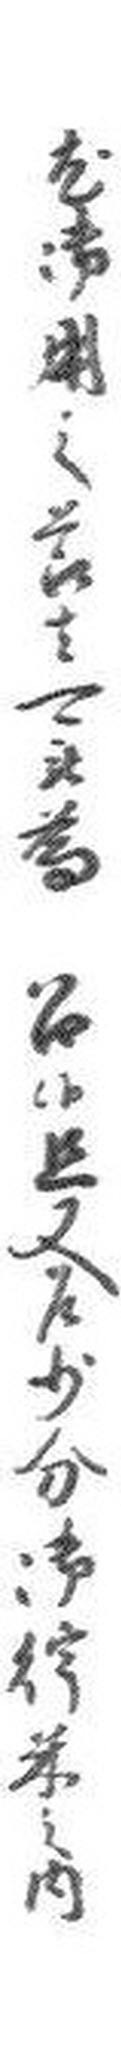尤御用之節者可被為召候且又乍少分貯米之内
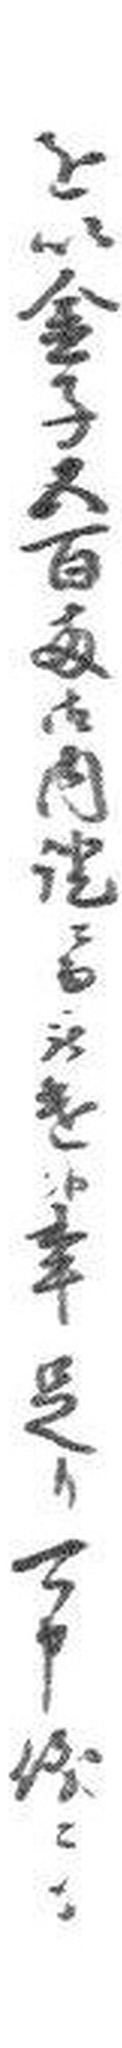を以金子五百両御内証ニ而被遣候事足り可申儀ニも
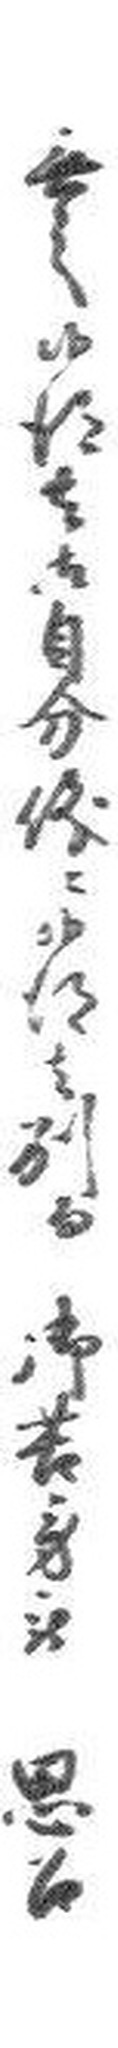無之候得者御自分儀ニ候得者別而御苦身被思召

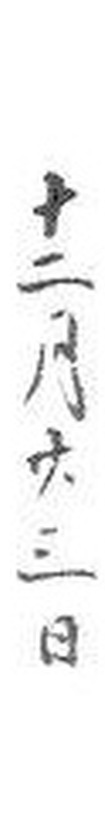十二月廿三日
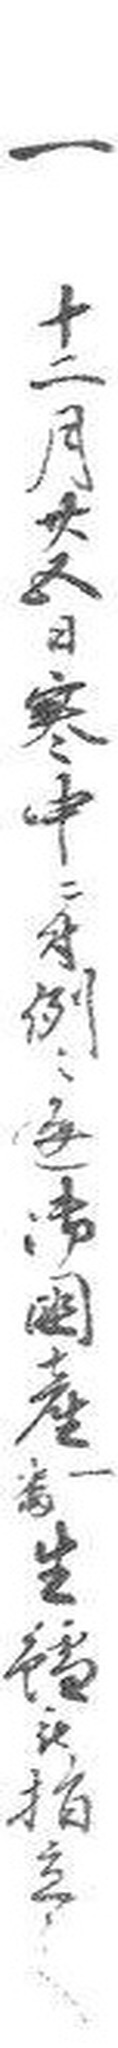一十二月廿五日寒中ニ付例之通御国産一番生鱈指立之
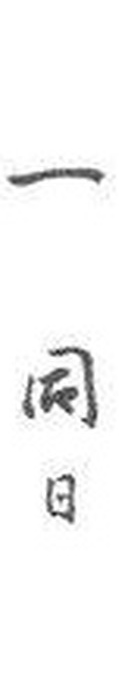一同日
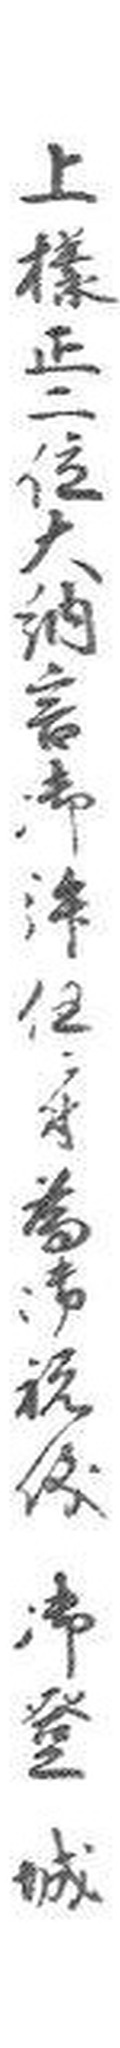上様正二位大納言御拝任ニ付為御祝儀御登城
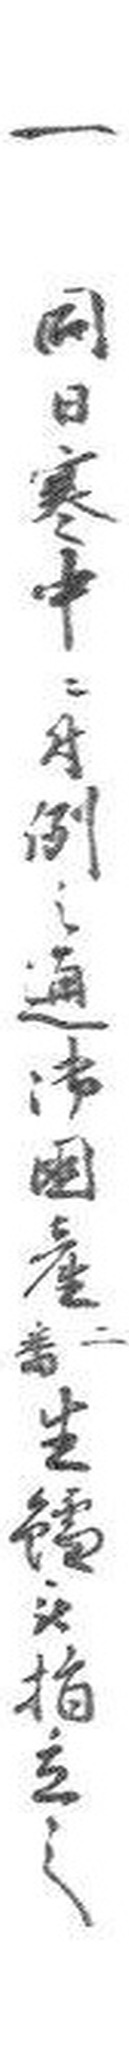一同日寒中ニ付例之通御国産ニ番生鱈被指立之
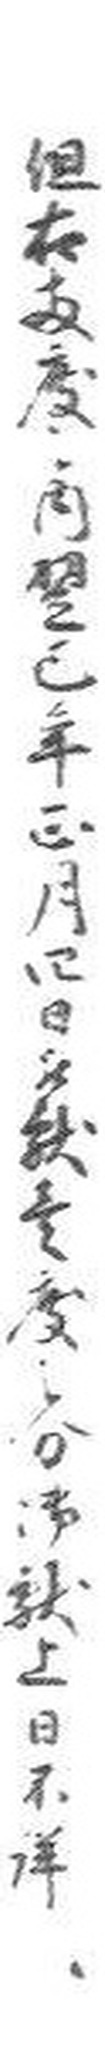但右両度之内翌巳年正月四日被献壱度之分御献上
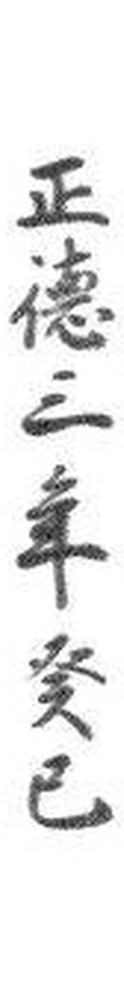正徳三年癸巳
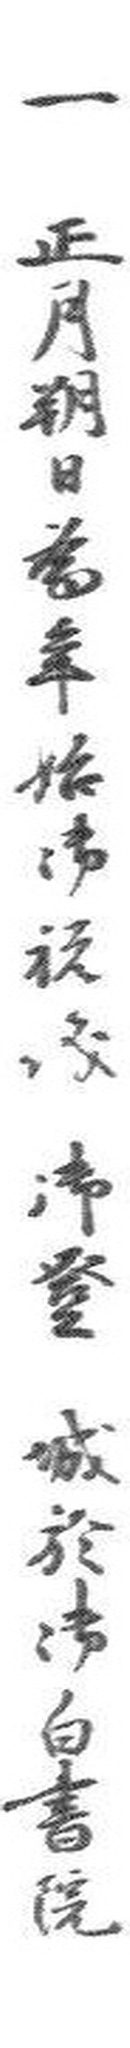一正月朔日為年始御祝儀御登城於御白書院
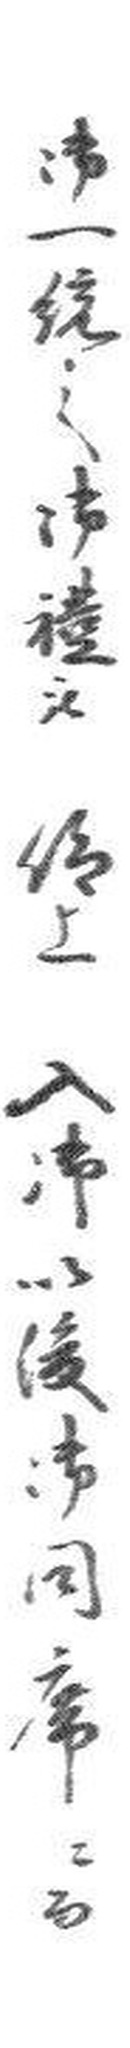御一統之御礼被仰上入御以後御同席ニ而
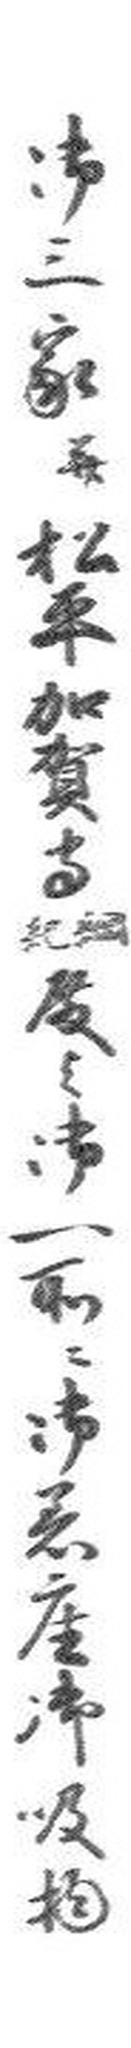御三家并松平加賀守綱紀殿与御一所ニ御着座御吸物
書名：家譜 二十九 吉邦公 従正徳二年到正徳三年
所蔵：福井県文書館 Fukui Prefectural Archives
